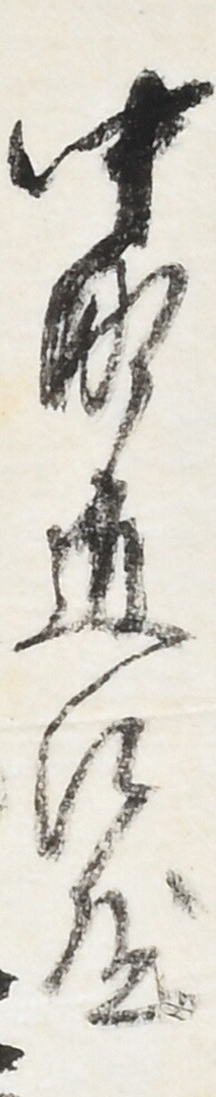中町近江屋
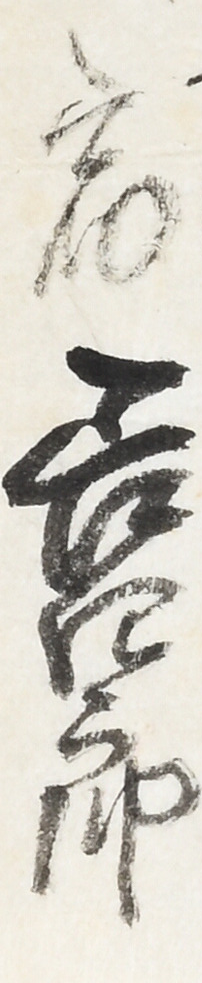宿善四郎
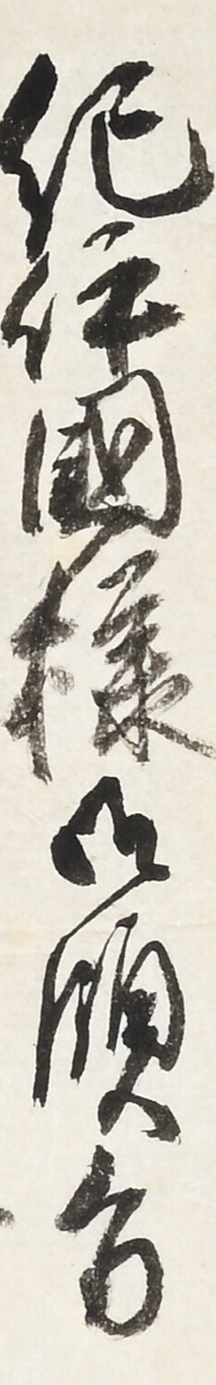紀伊国様御領分
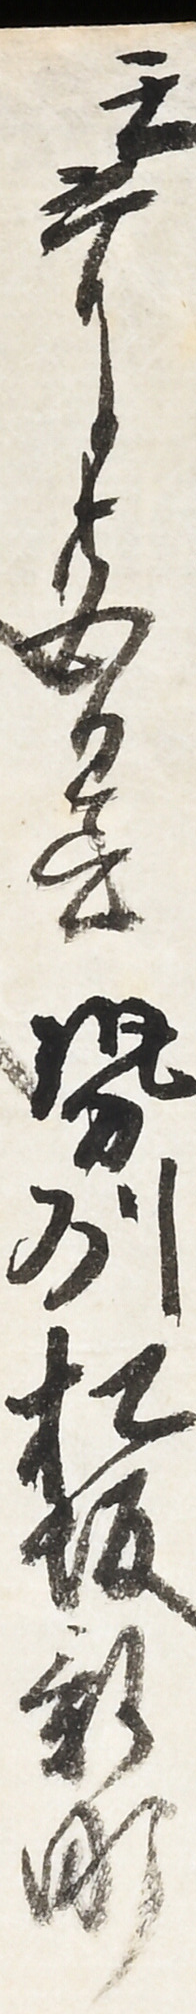壬六月廿五日着勢州松坂新町
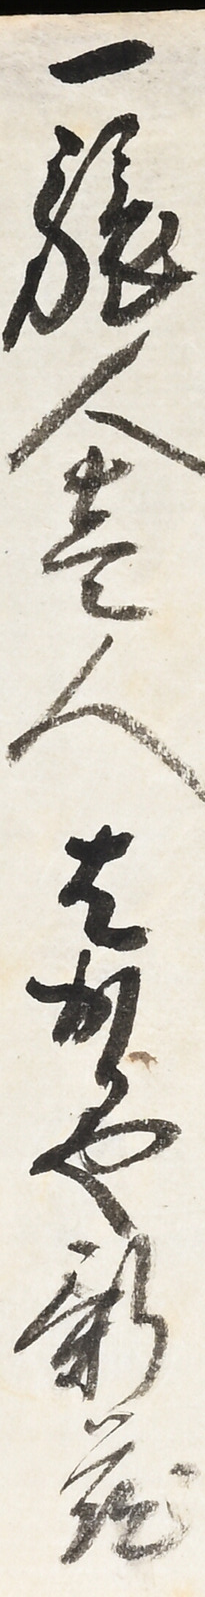一旅人壱人はかりや新蔵
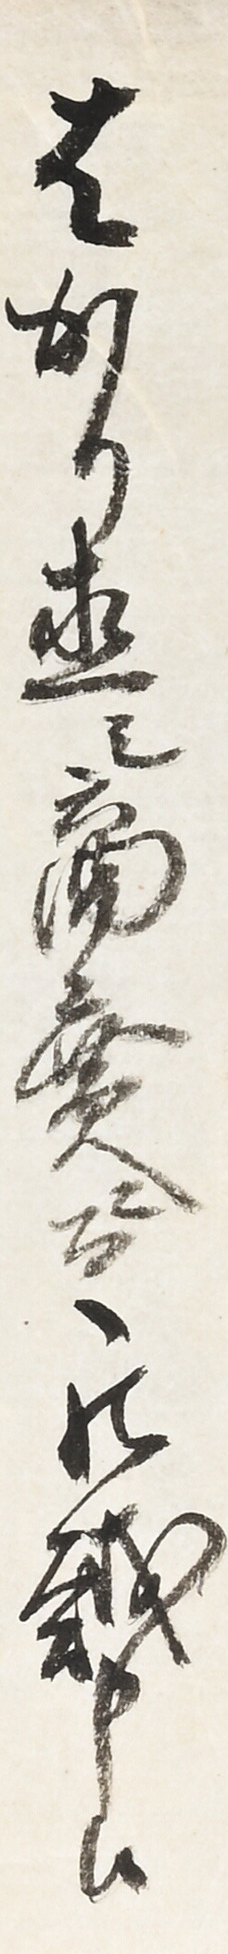はかり直シ商売ニ而罷越申候
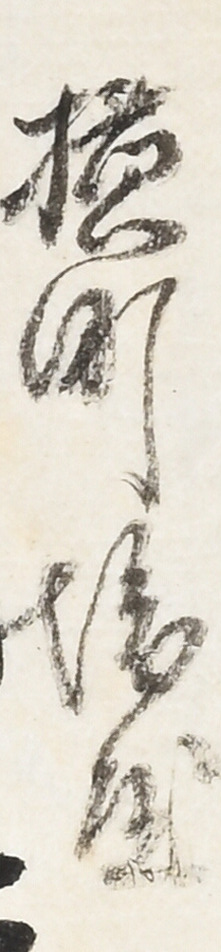横町塩屋
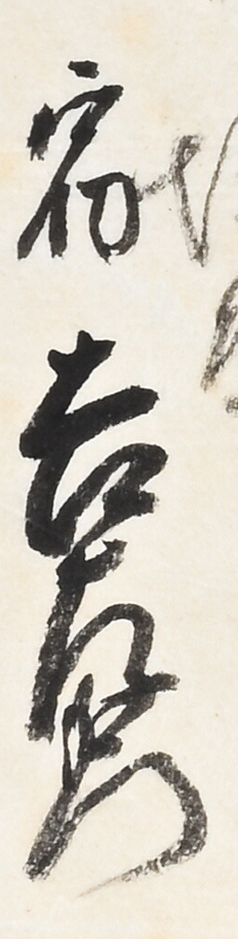宿吉左衛門
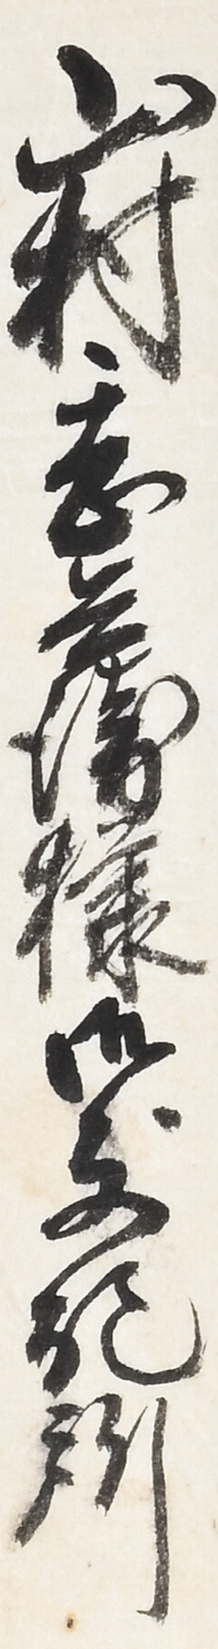山村甚兵衛様御支配所
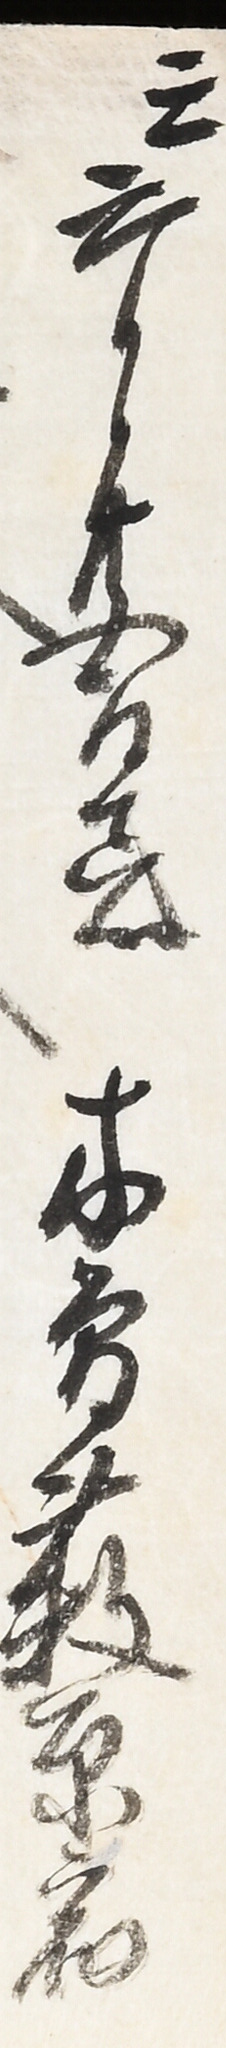壬六月廿五日着木曽藪原宿
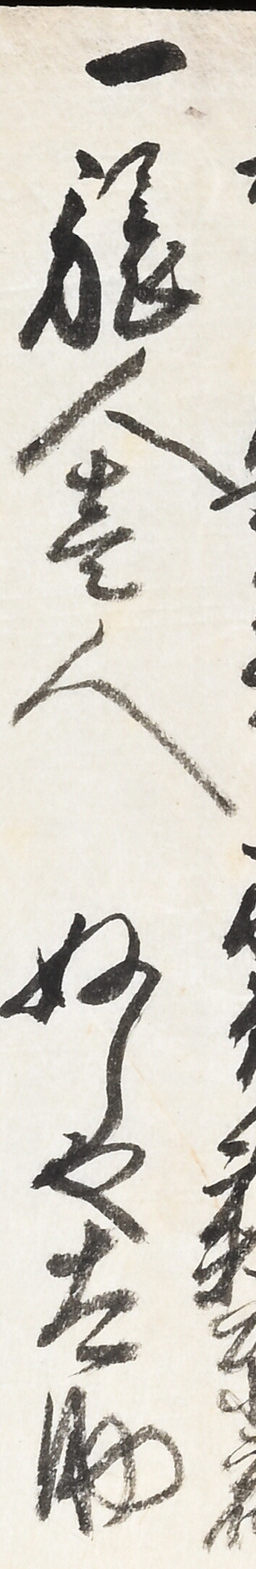一旅人壱人ぬしや太助
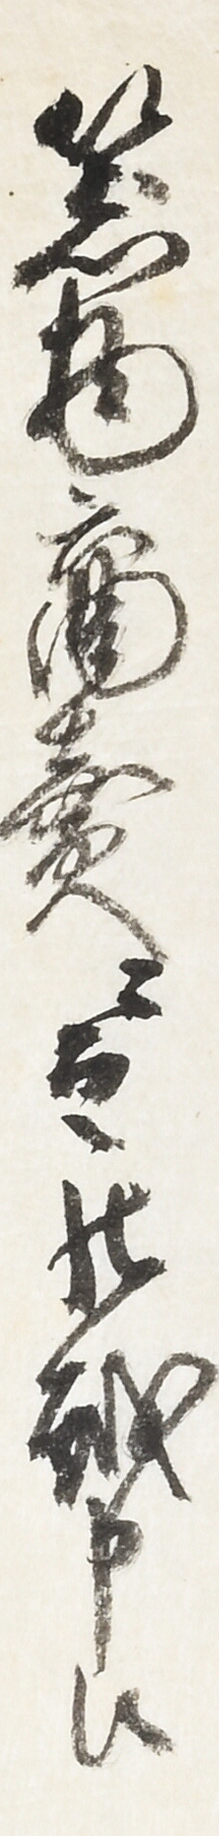器物商売ニ而罷越申候
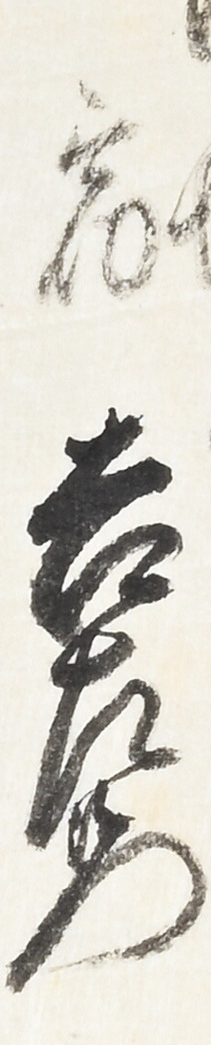宿吉左衛門

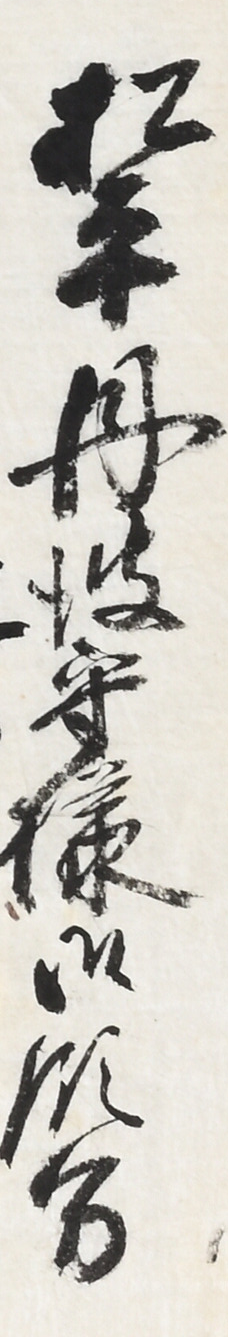松平丹波守様御領分
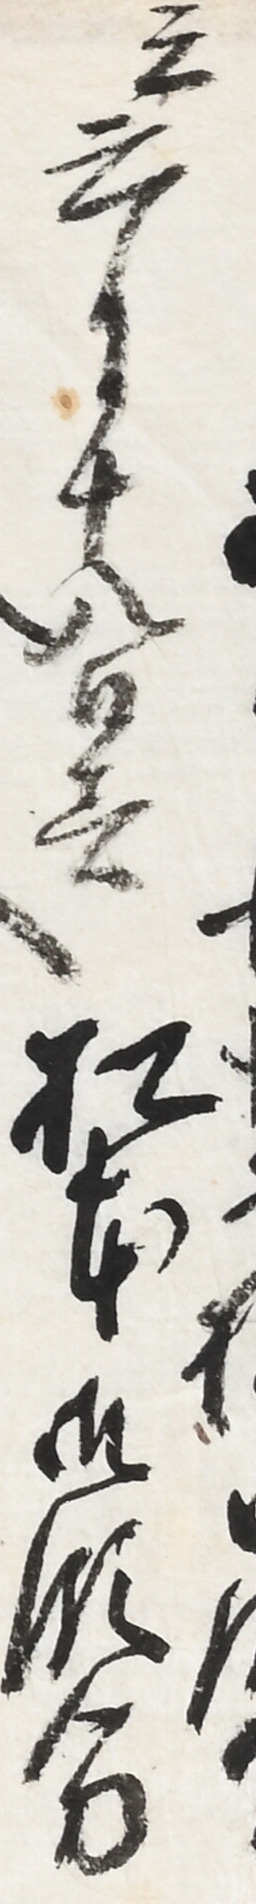壬六月十八日着松本御領分
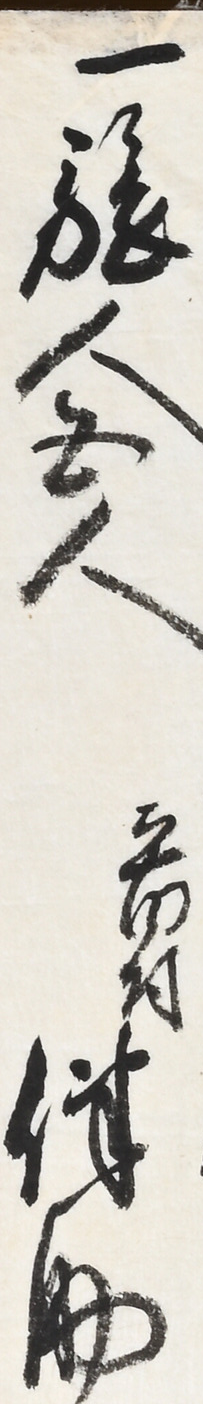一旅人五人平田村伴助
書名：旅人泊控帳
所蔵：伊那市立高遠町図書館・合同会社AMANE
